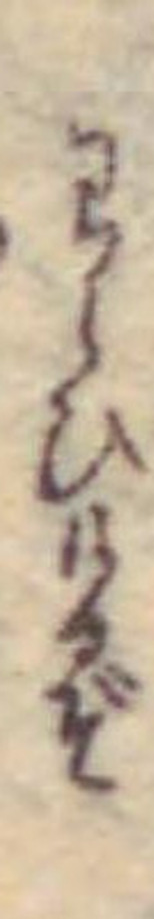わらひけるぞ
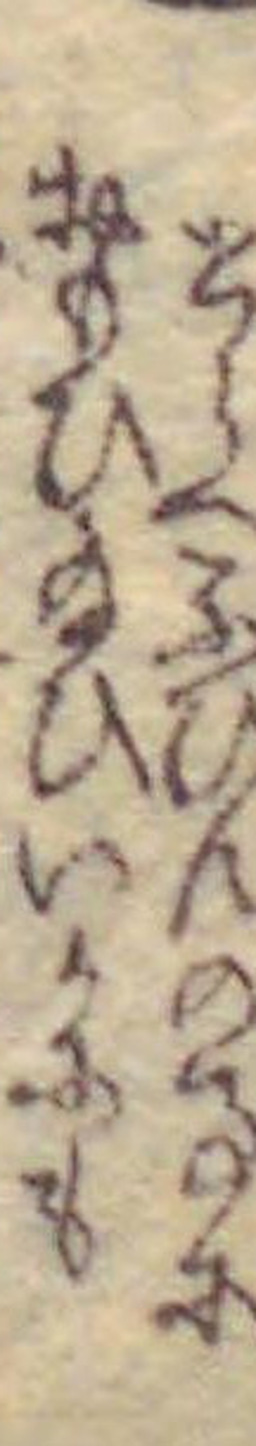おもひ給ひいかにも
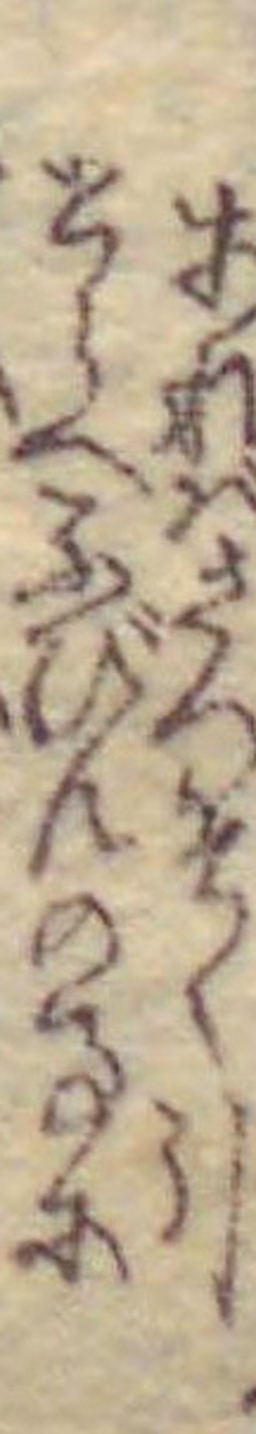とらへふびんの事に
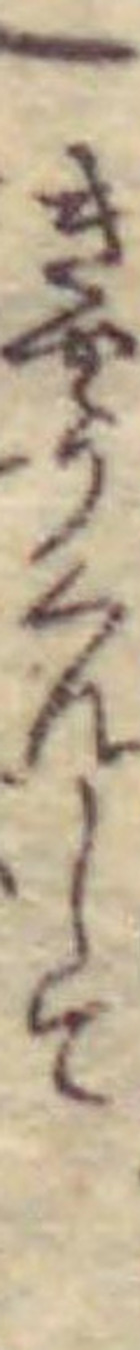きやうくんして
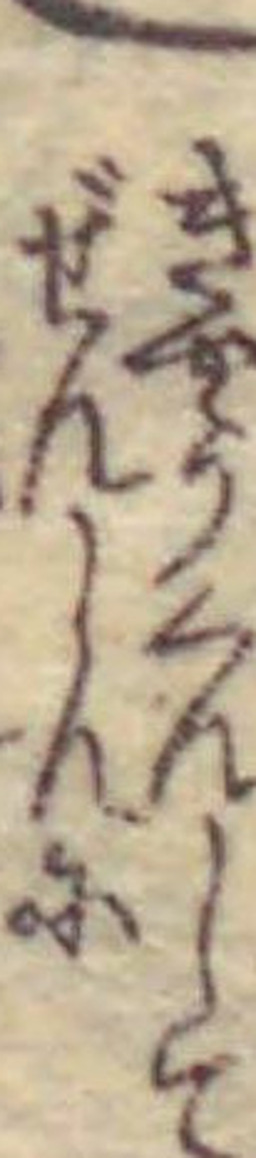ぜんしんに
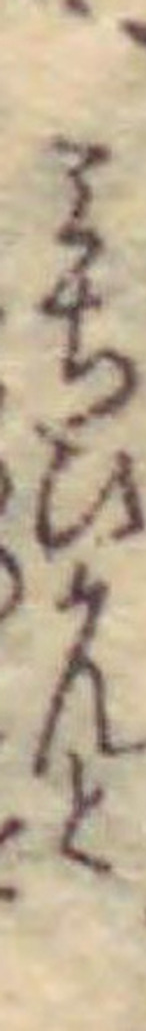みちひかんと
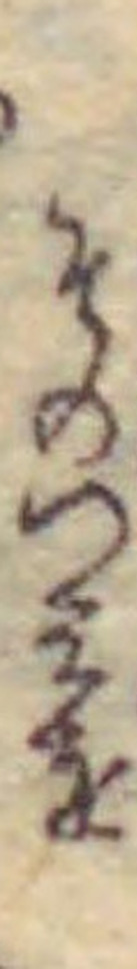そのつみを
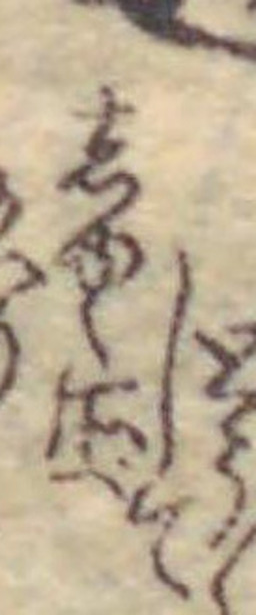しゆく所へ
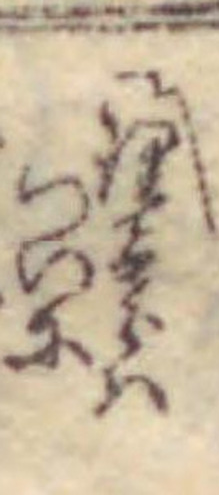ついに
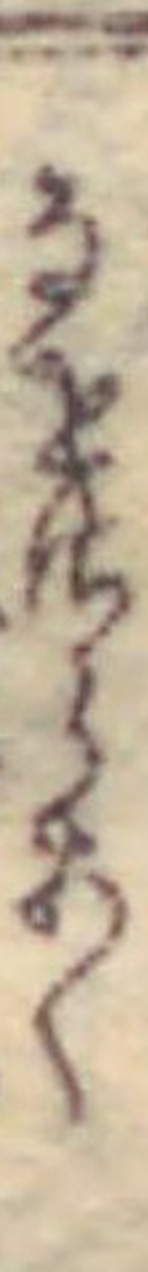なをさらあく
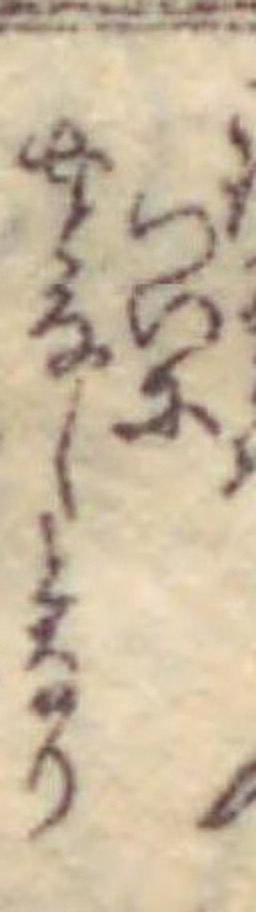やとなしとなり
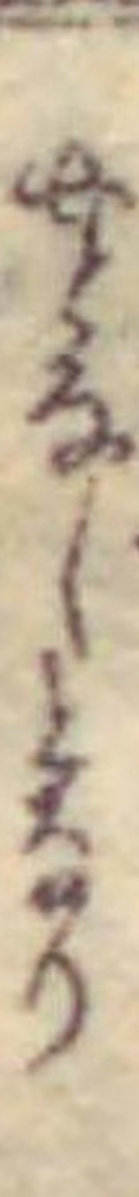やとなしとなり
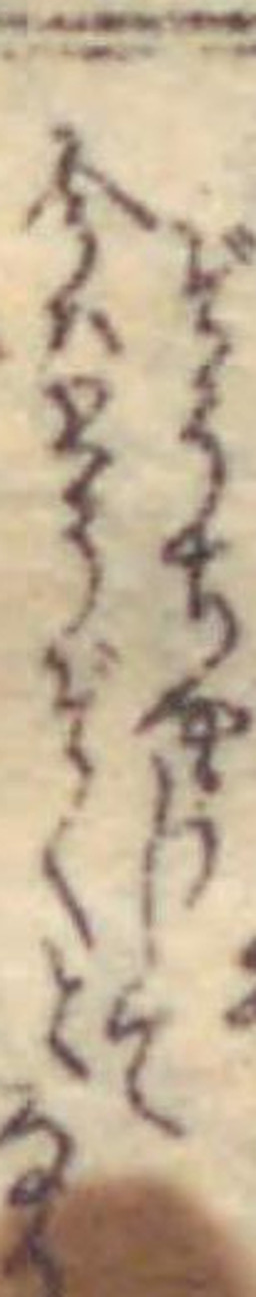今はとうぞくとなり
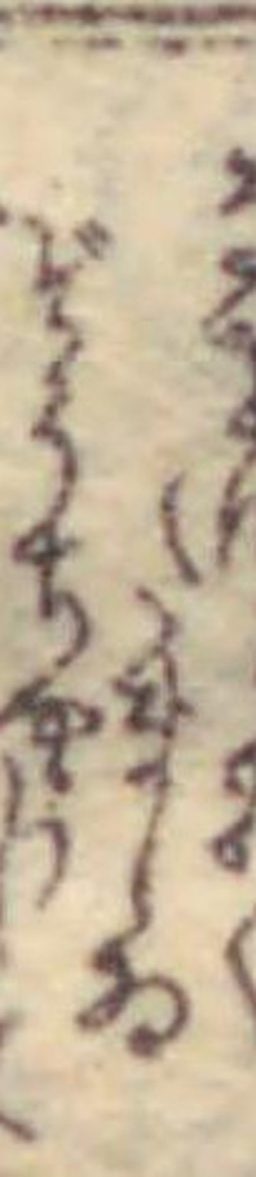どちやうして
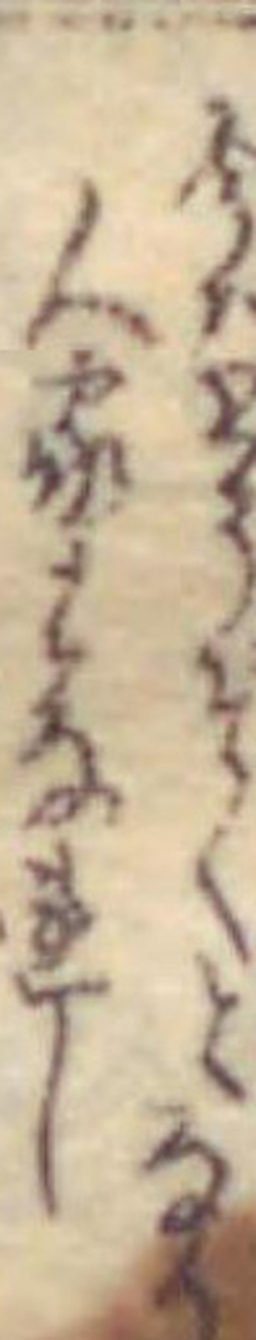人家はなれし
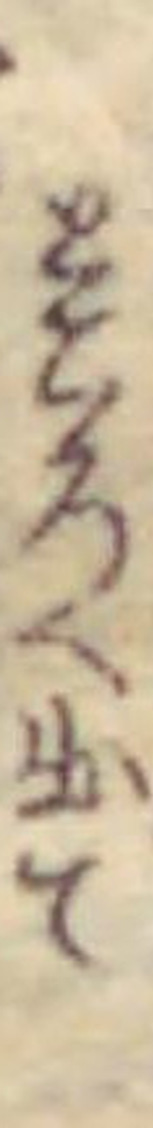ところへ出て
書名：心学早染艸 : 3巻
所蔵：国立国会図書館 National Diet Library, JAPAN
